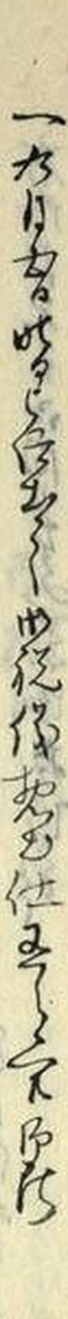一九月五日昨日被仰出之御祝儀惣出仕有之候へ共御断
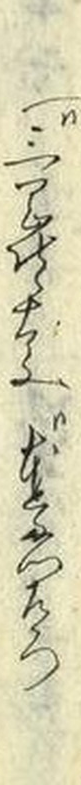同三岡次郎太夫同本多門左衛門
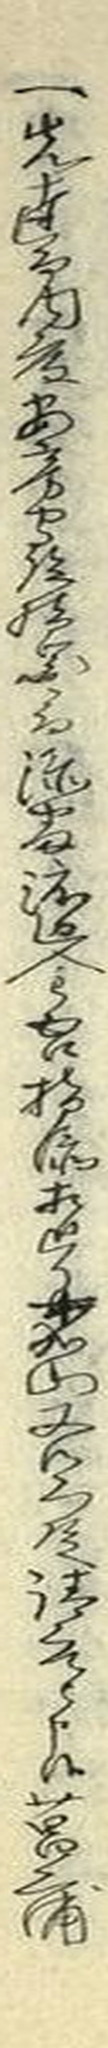一先達而内藤安房守殿指図ニ而添番渡辺金吾指添相廻り森山又左衛門殿請取被申候菖蒲
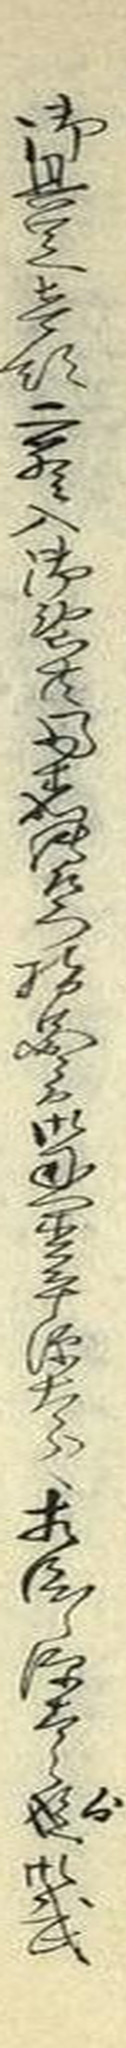御具足壱領二箱ニ入御台共雨森伝左衛門指図ニ而御用人松平源太郎へ相渡之源太郎ゟ御武
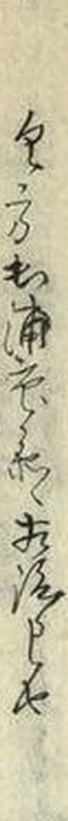具方出浦市郎兵衛へ相渡申候由
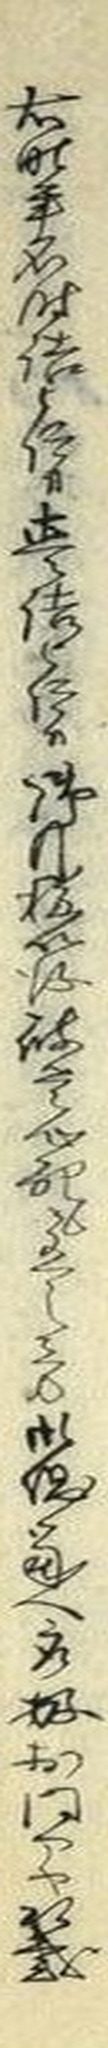右昨年不時詰被仰付直ニ詰被仰付御引移以後彼是心配も有之旁御側御用人取扱於同部屋頂戴

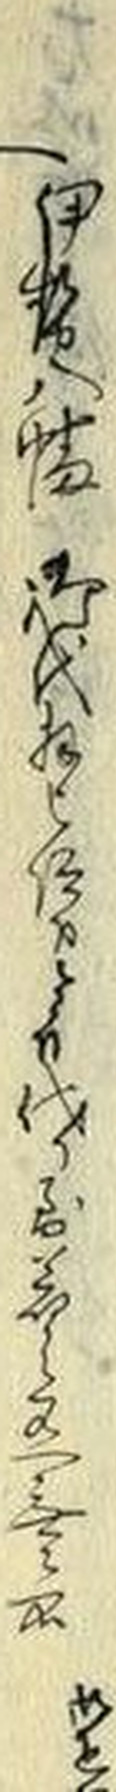伊勢八幡御代拝被仰付候ニ付代り到着之有無ニ不
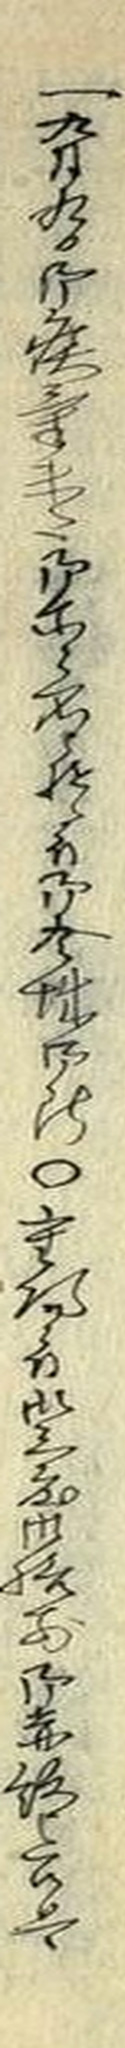一九月九日御疾気未た御楽ニ不被遊候ニ付御登城御断〇重陽ニ付御三度御膳前御赤飯被召上候
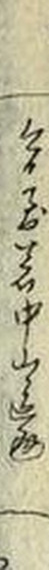今日到着中山道通
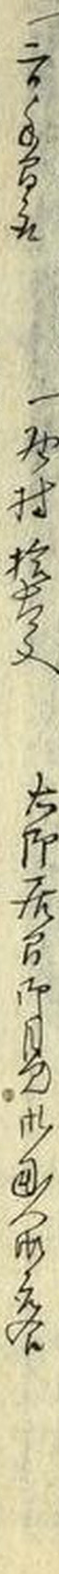野村拾太夫右御居間御目見御用人御取合
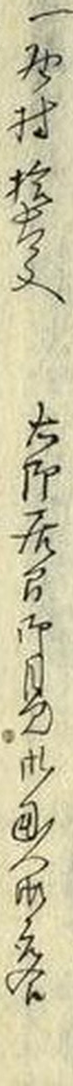野村拾太夫右御居間御目見御用人御取合
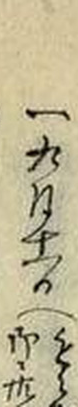一九月十二日
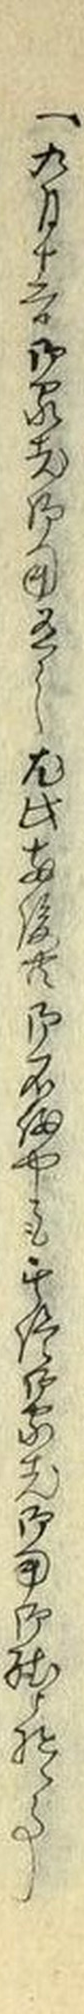御家老御用有之尤此前後共御不例中ニも其儘御家老御用御聴被遊候事
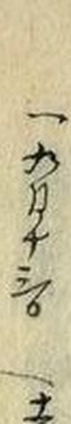一九月十二日
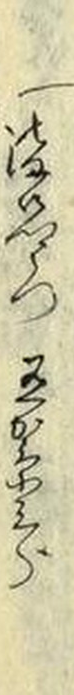溝口郷右衛門有賀小三郎
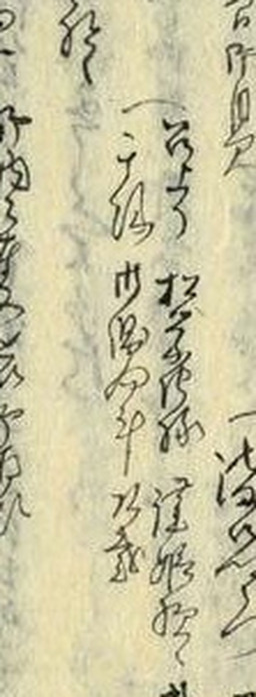其余御側向斗頂戴
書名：少傅日録抄（斉善付側向頭取日記、在府）
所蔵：福井県文書館 Fukui Prefectural Archives
